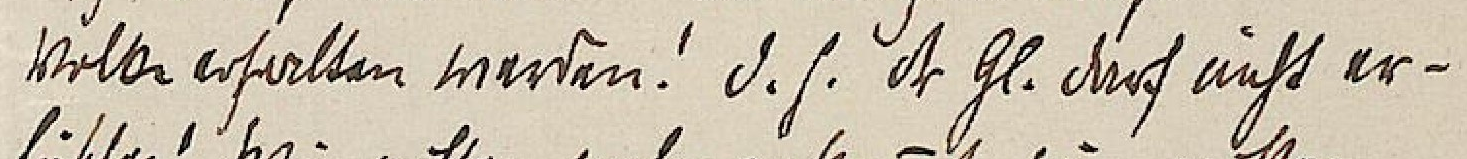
Volke erhalten werden! d. h. der Gl. darf nicht er¬
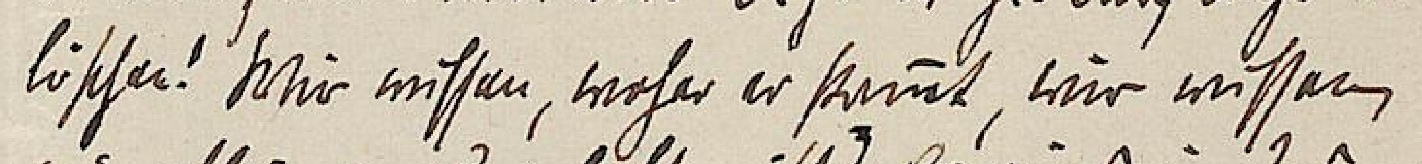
löschen. Wir wissen, woher er stammt, wir wissen,
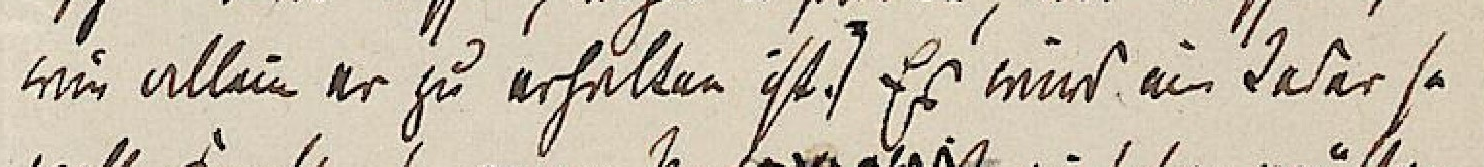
wie allein er zu erhalten ist. ] Es wird ein Jeder sn
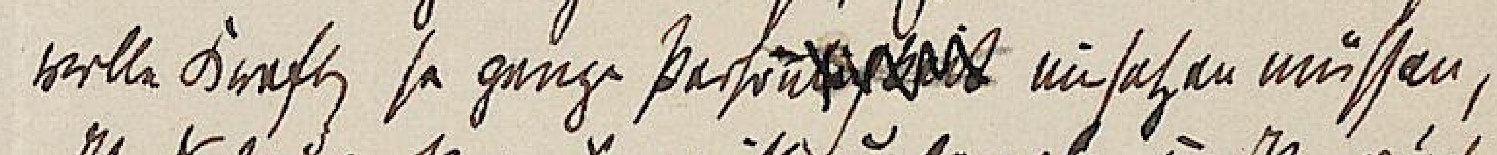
volle Kraft; sn ganze Persönlichkeit einsetzen müssen,
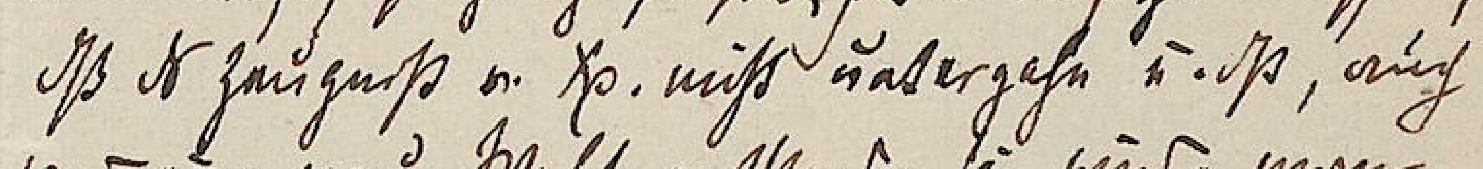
daß das Zeugniß v. Χρ. nicht untergehe u. dß, auch
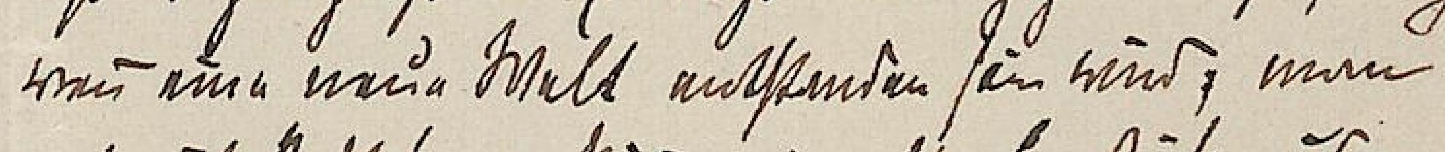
wen eine neue Welt entstanden sein wird; man
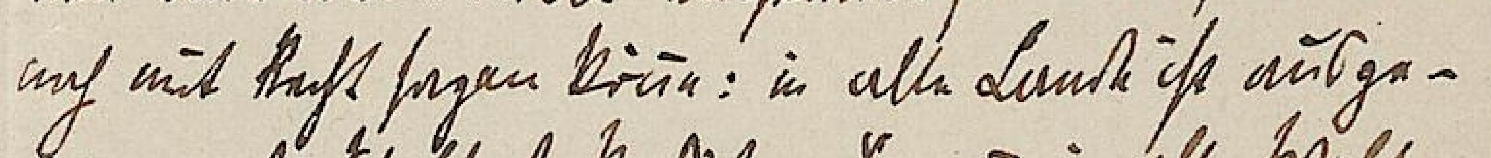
noch mit Recht sagen könne: in alle Lande ist ausge¬
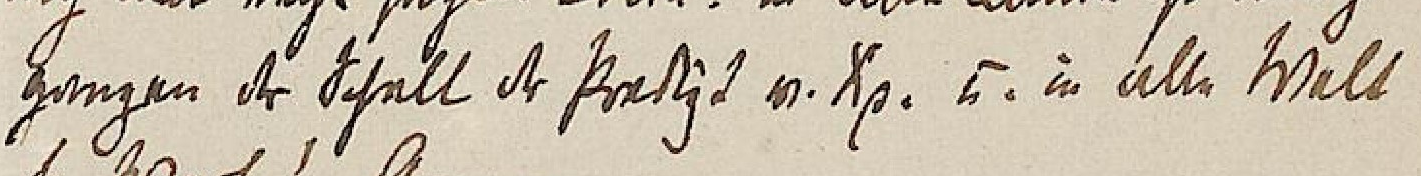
gangen der Schall der Predigt die. v. Χρ. u. in alle Welt
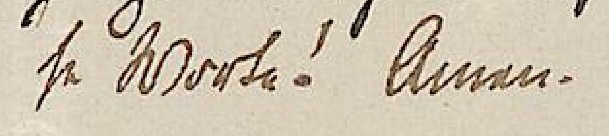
sn Worte! Amen.
